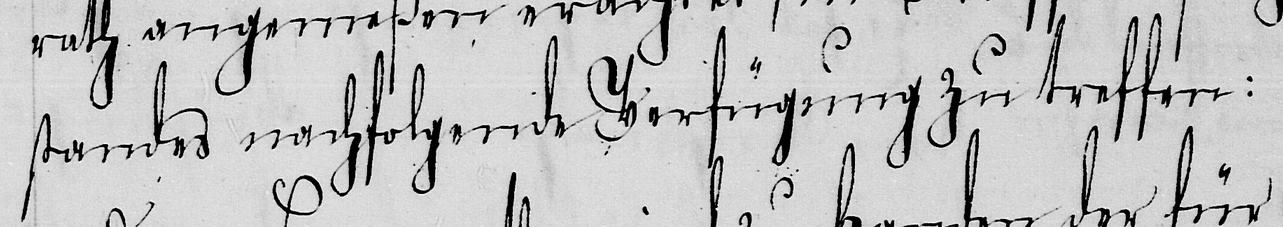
standes nachfolgende Verfügung zu treffen:
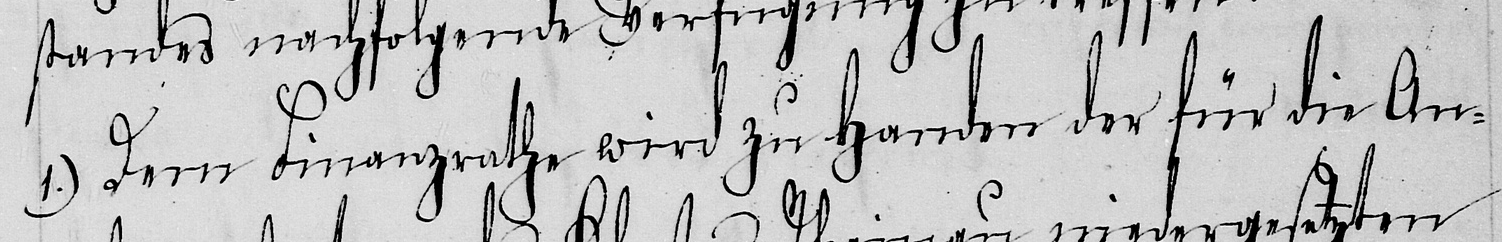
1.) Dem Finanzrathe wird zu Handen der für die An¬
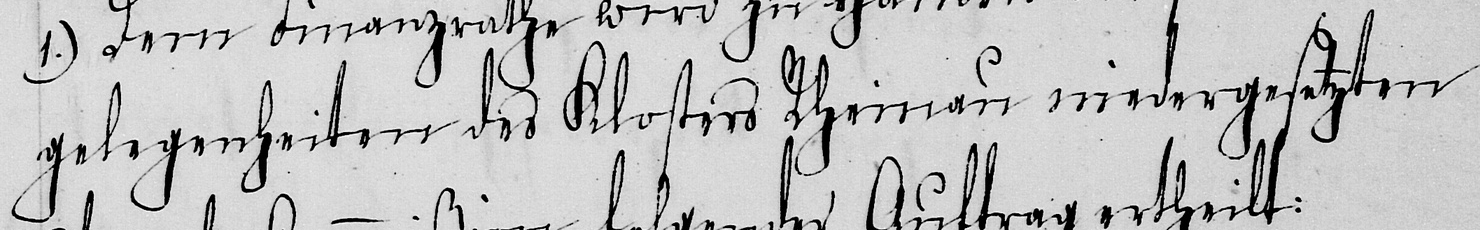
gelegenheiten des Klosters Rheinau niedergesetzten
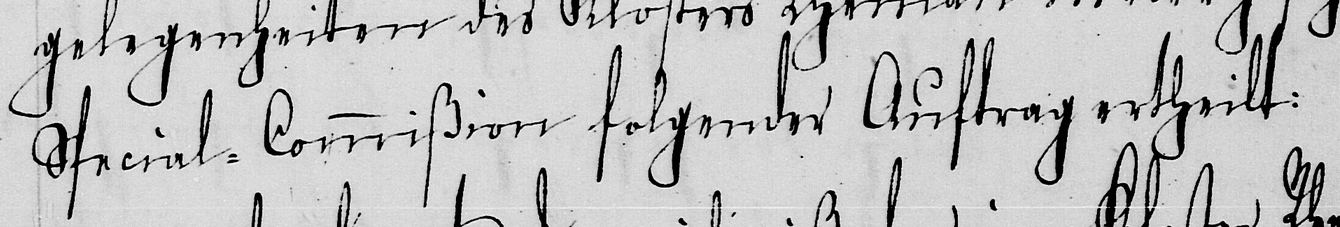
Special-Commißion folgender Auftrag ertheilt:
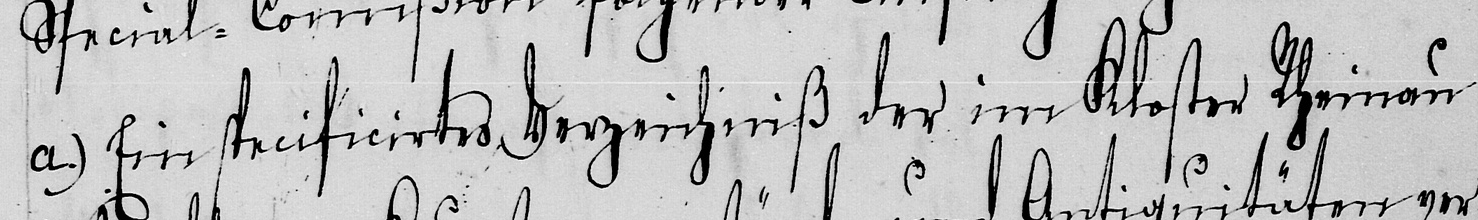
a.) Ein specificirtes Verzeichniß der im Kloster Rheinau
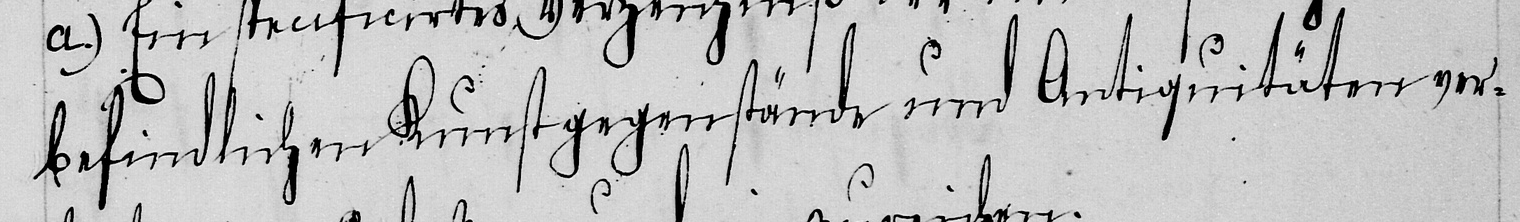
befindlichen Kunstgegenstände und Antiquitäten ver¬
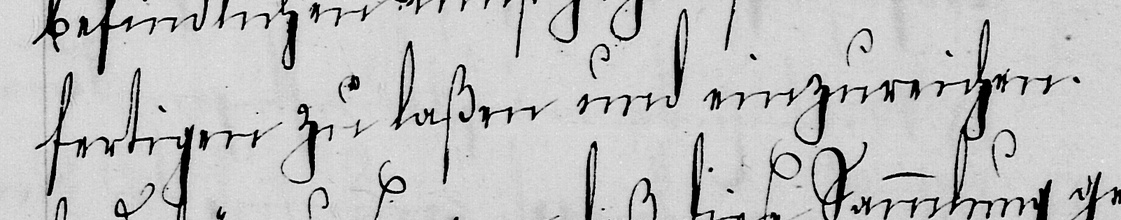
fertigen zu laßen und einzureichen.
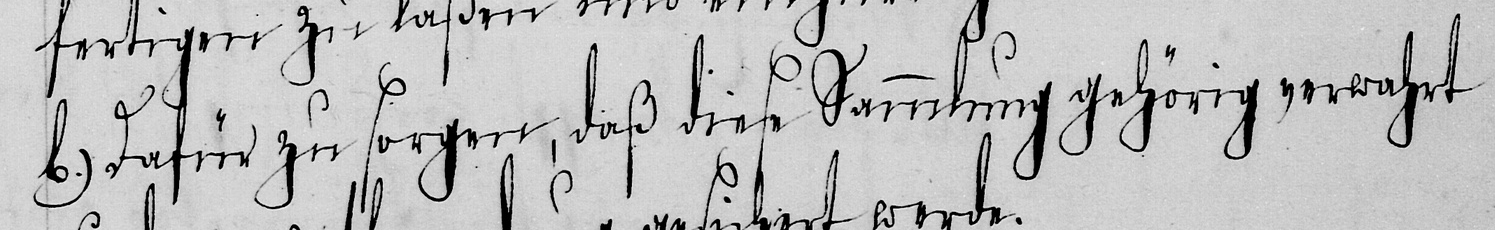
b.) Dafür zu sorgen, daß diese Sammlung gehörig verwahrt
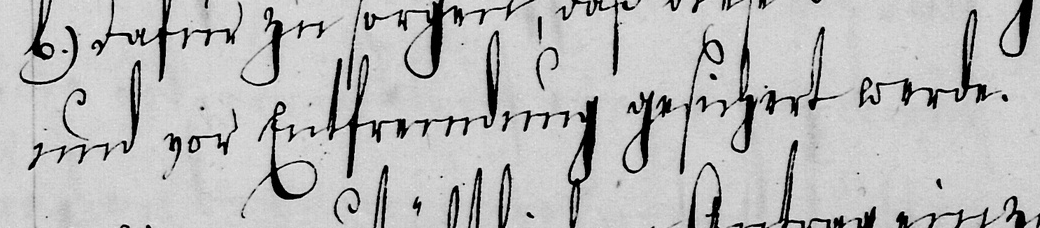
und vor Entfremdung gesichert werde.
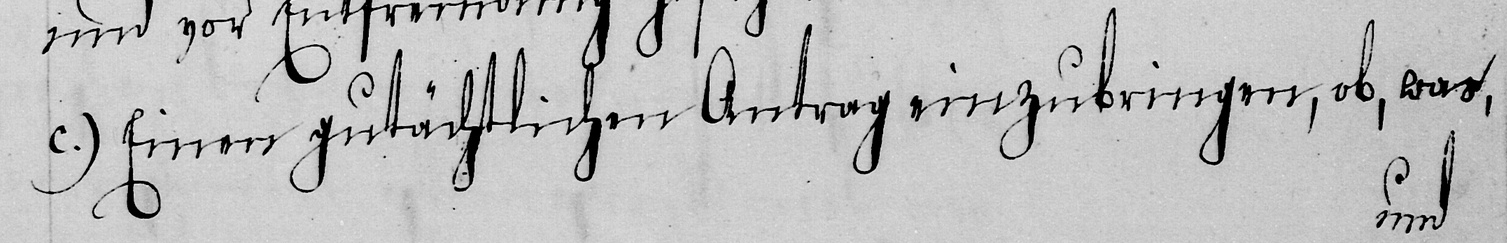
c.) Einen gutächtlichen Antrag einzubringen, ob, was,
